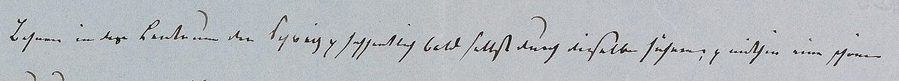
Bahnen in das Centrum der Schweiz & hoffentlich bald selbst durch dieselbe führen, & mithin eine schöne
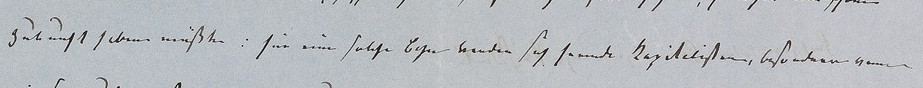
Zukunft haben müßte: für eine solche Bahn werden sich fremde Kapitalisten, besonders wenn
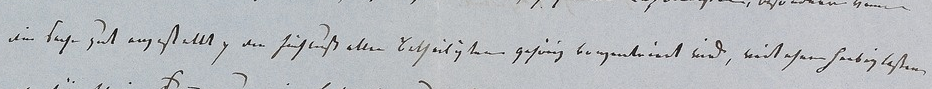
die Sache gut angestellt & der Einfluß aller Betheiligten gehörig konzentriert wird, weit eher herbeylaßen
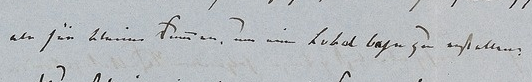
als für kleine Summen, um eine Lokal Bahn zu erstellen.
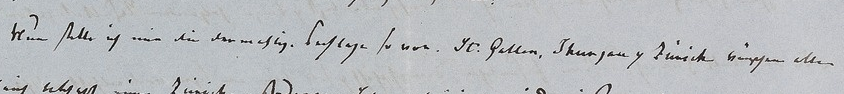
Nun stelle ich mir die dermahlige Sachlage so vor. St. Gallen, Thurgau & Zürich wünschen alle
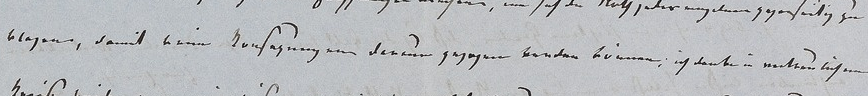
klagen, damit keine Konsequenzen daraus gezogen werden können, ich denke in vertraulichem
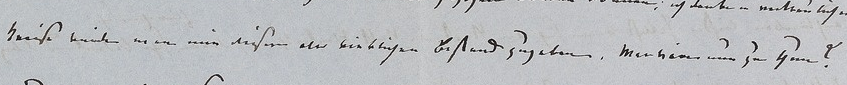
Kreise würde man nie dieses als wirklichen Bestand zugeben. Was wäre nun zu thun?
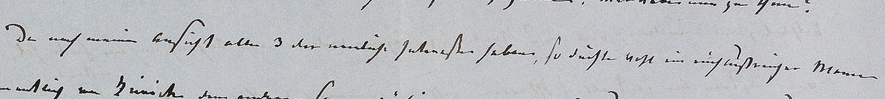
Da nach meiner Ansicht alle 3 das nemliche Intereße haben, so dürfte wohl ein einflußreicher Mann
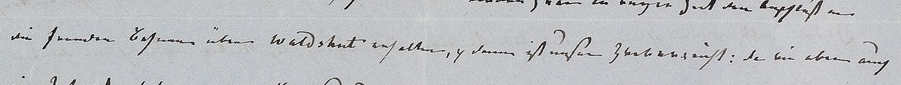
die fremden Bahnen über Waldshut erhalten, & dann ist unser Zwek erreicht: da wir aber auch
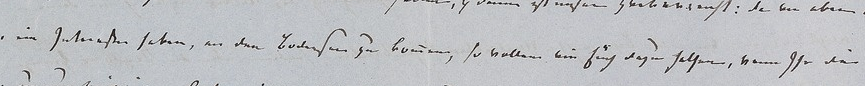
ein Intereße haben, an den Bodensee zu kommen, so wollen wir Euch dazu helfen, wenn Ihr die
